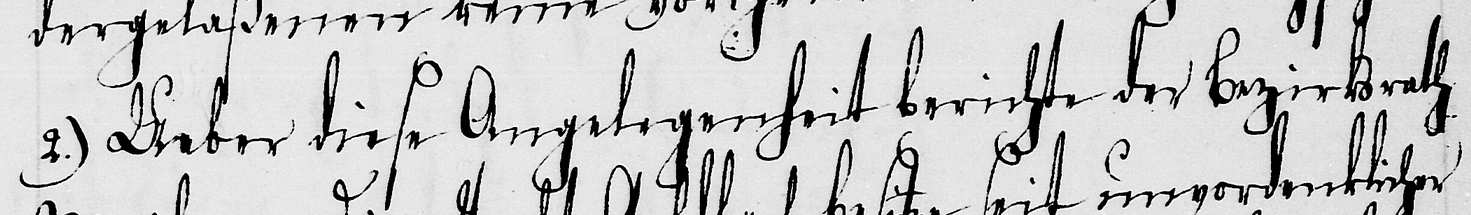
2.) Ueber diese Angelegenheit berichte der Bezirksrath
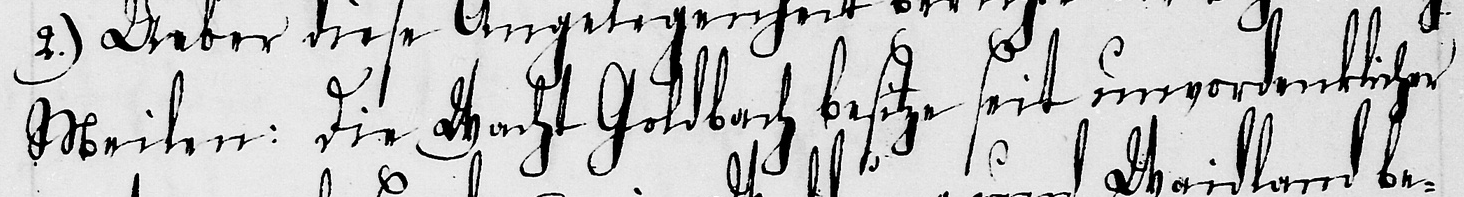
Meilen: Die Wacht Goldbach besitze seit unvordenklich¬
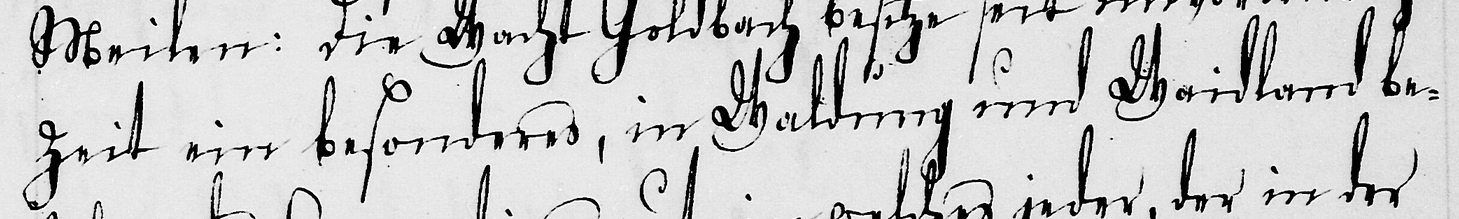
Zeit ein besonderes, in Waldung und Waidland be¬
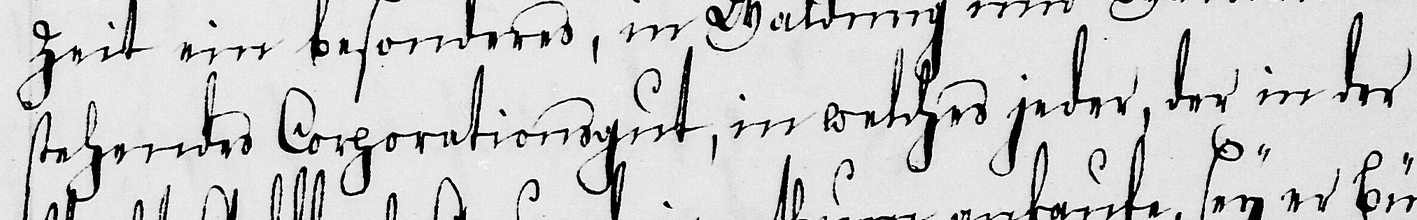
stehendes Corporationsgut, in welches jeder, der in der
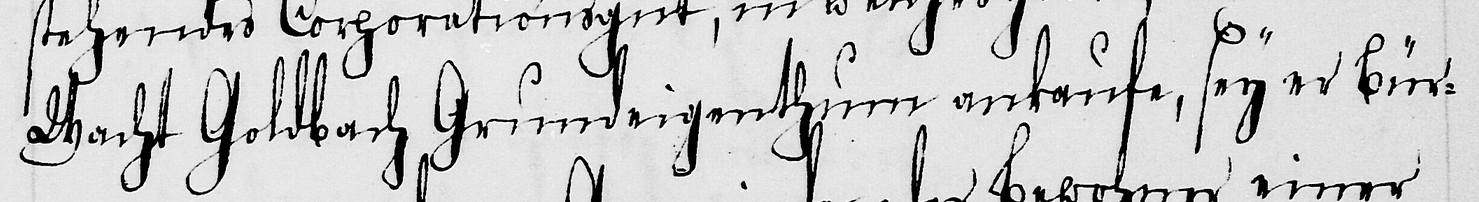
Wacht Goldbach Grundeigenthum ankaufe, sey er Bür¬
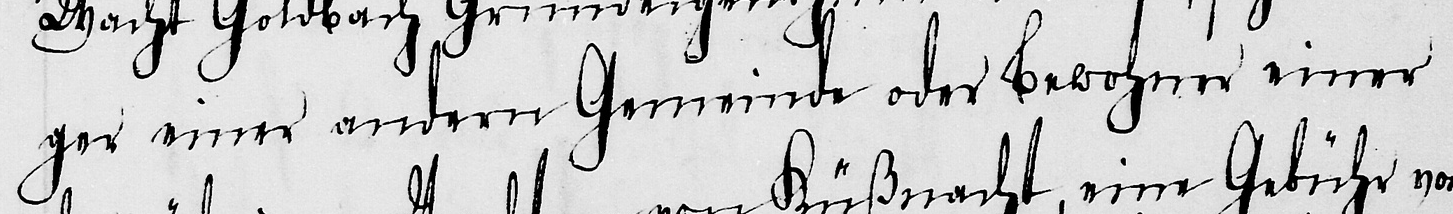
ger einer andern Gemeinde oder Bewohner einer
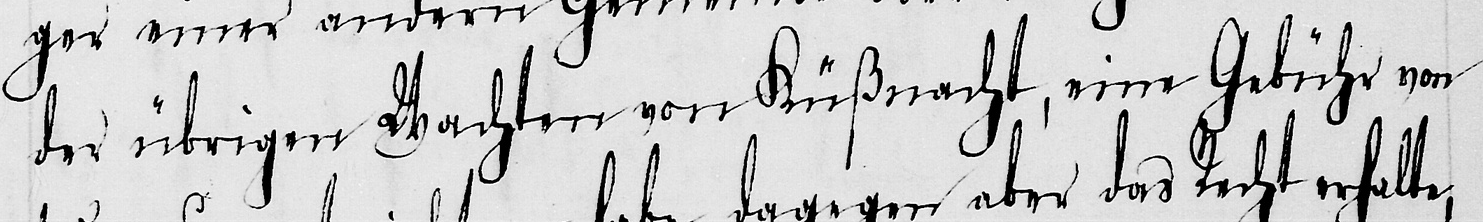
der übrigen Wachten von Küßnacht, eine Gebühr von
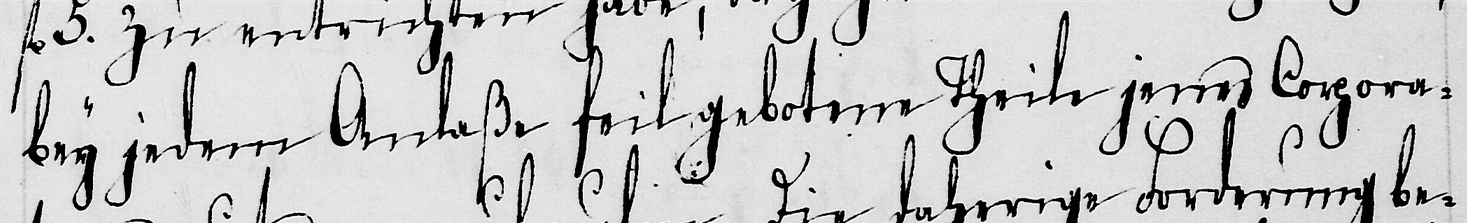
bey jedem Anlaße feil gebotene Theile jenes Corporta¬
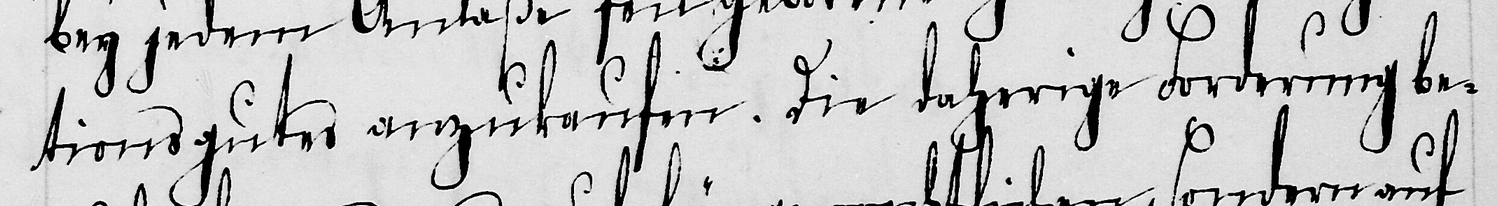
tionsgutes anzukaufen. Die daherige Forderung be¬
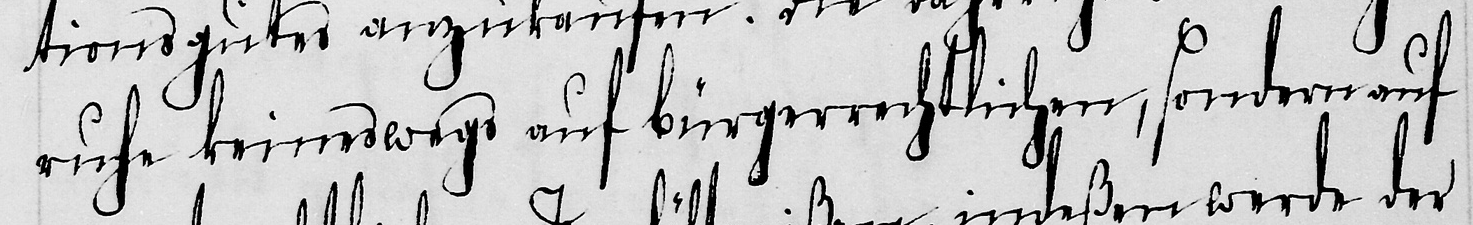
ruhe keineswegs auf bürgerrechtlichen, sondern auf
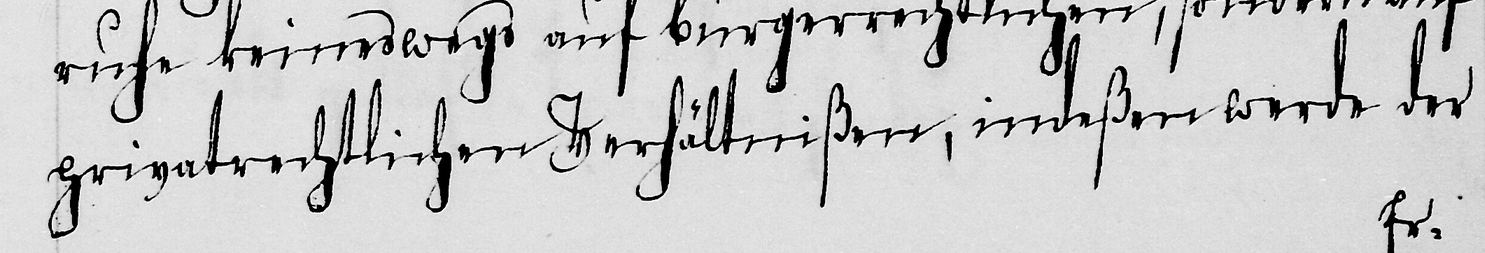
privatrechtlichen Verhältnißen, indeßen werde der
